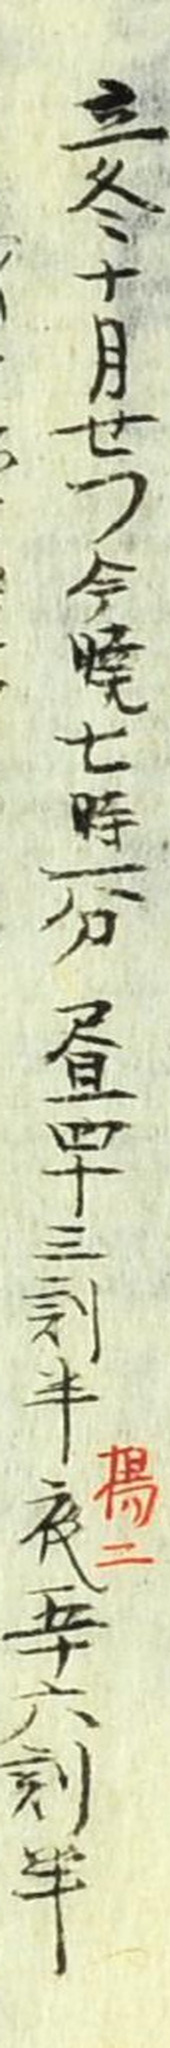立冬十月せつ今暁七時一分昼四十三刻半夜五十六刻半早
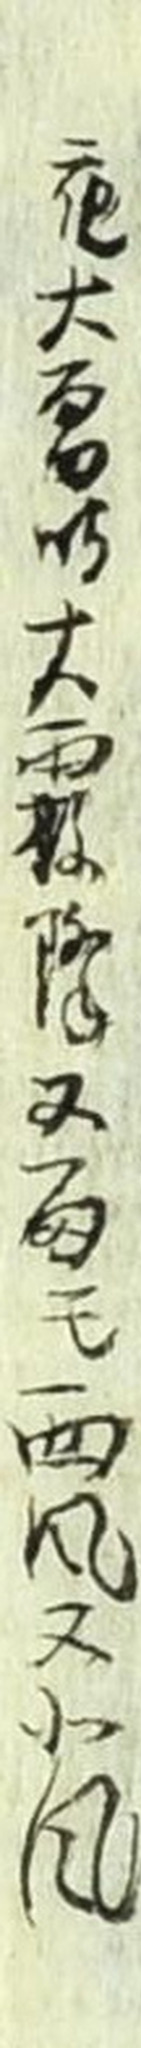夜大雷鳴霜降又雨モ西風又北風
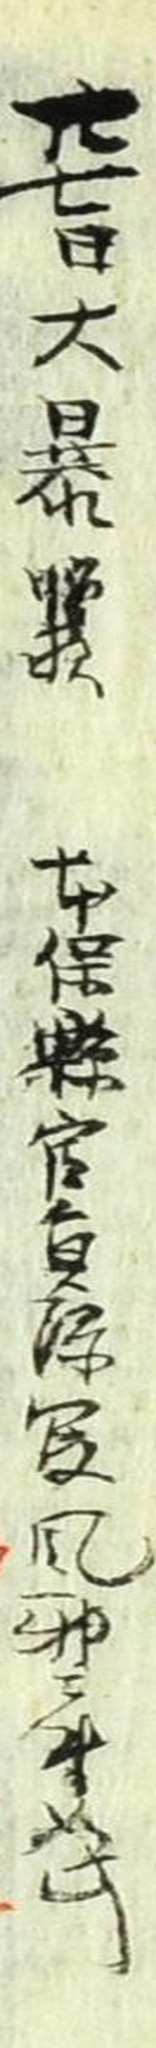廿七日大暴昨夜本保県官員録写風邪に付如此
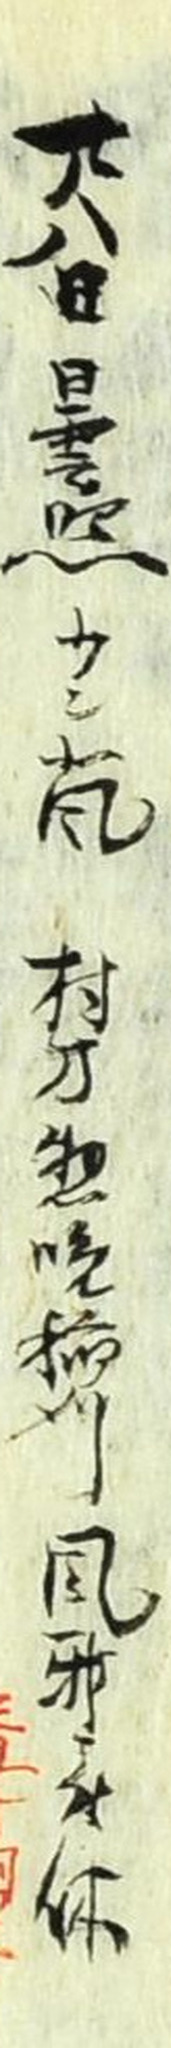廿八日曇照少し北風村方惣稲刈風邪に付休
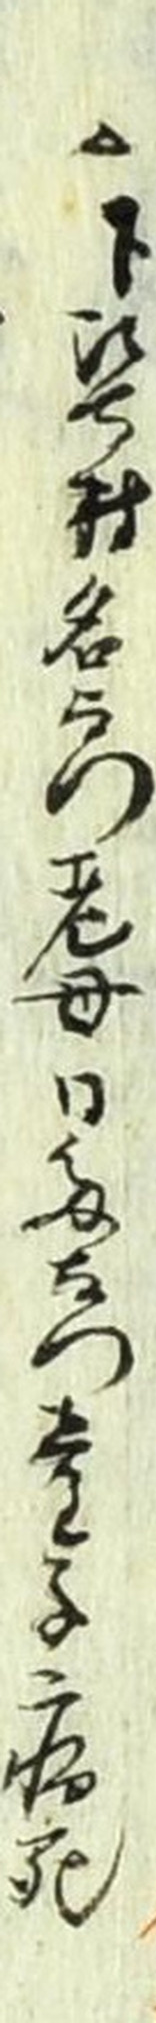△下江守村名右衛門老母同多左衛門童子病死
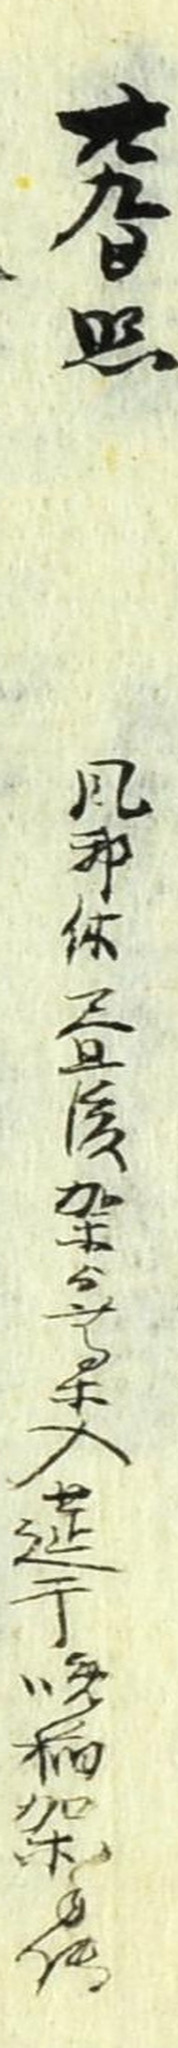廿九日照風邪休昼後架ゟ藁入莚干晩稲架手伝
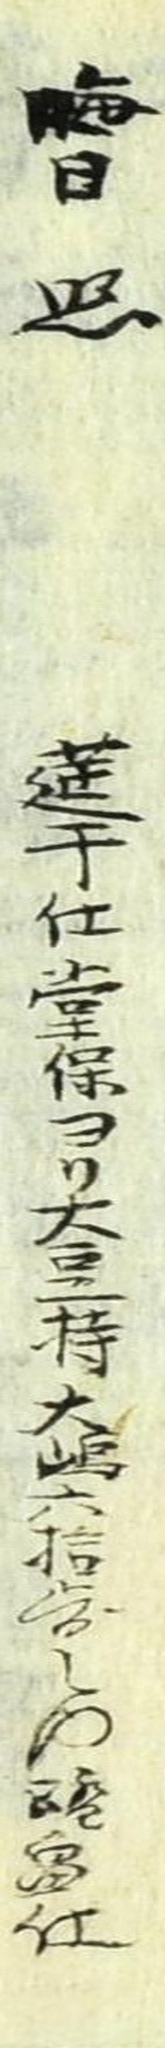晦日照莚干仕堂保ヨリ大豆大島六拾歩之内踏畠仕
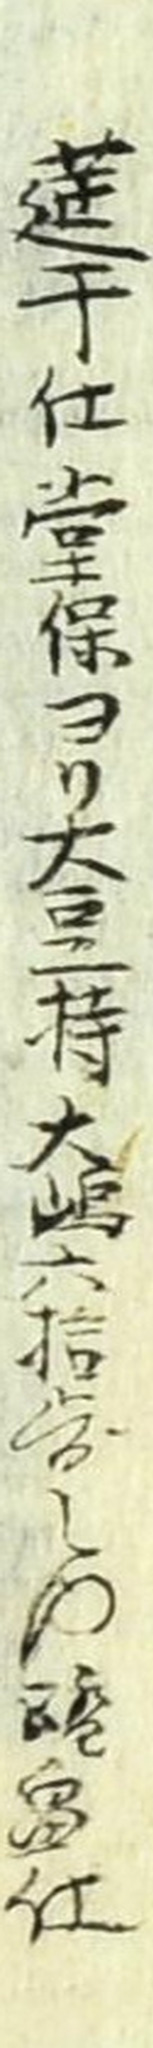晦日照莚干仕堂保ヨリ大豆大島六拾歩之内踏畠仕
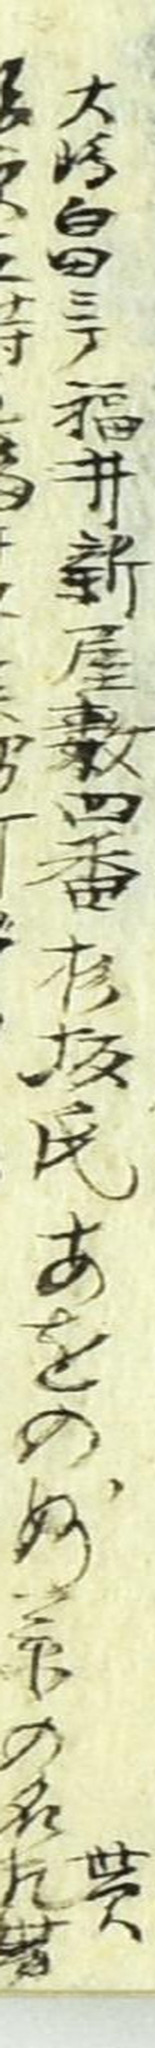大島畠ニテ福井新屋敷四番杉坂氏あをの妙薬の名歟貰
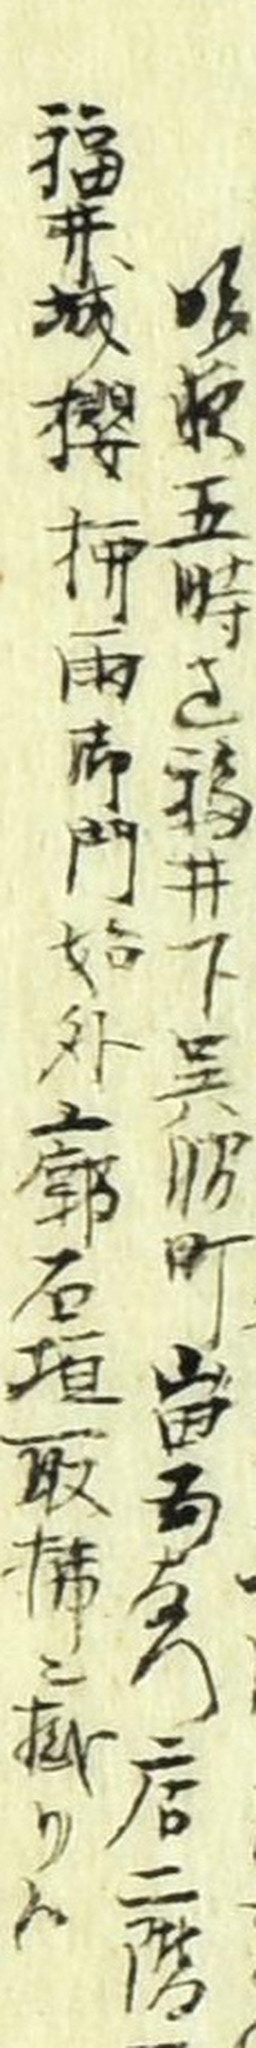福井城桜柳両御門始外廊石垣取掃ニ掛り候
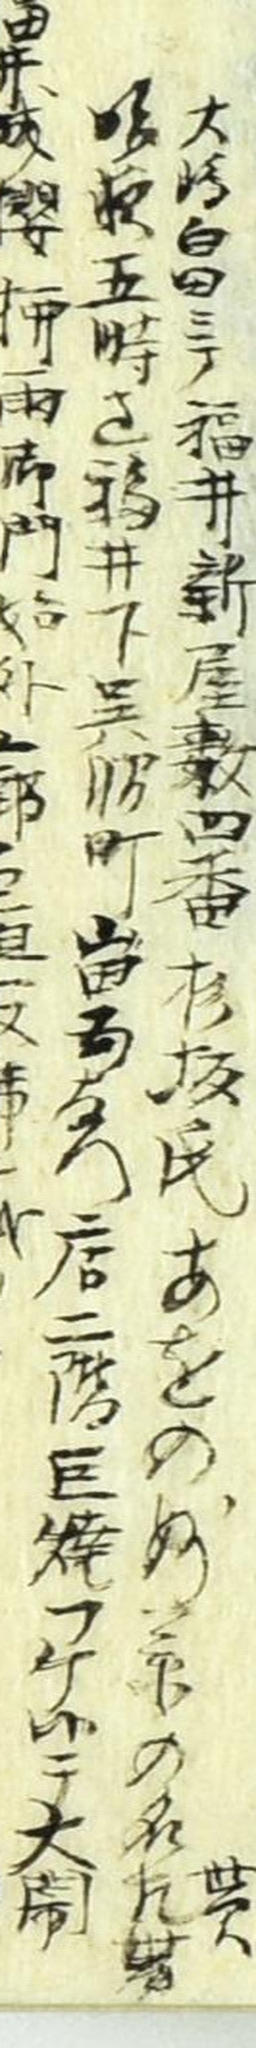昨夜五時過福井下呉服町山田五郎右衛門店二階巨焼フケ候テ大閙之由

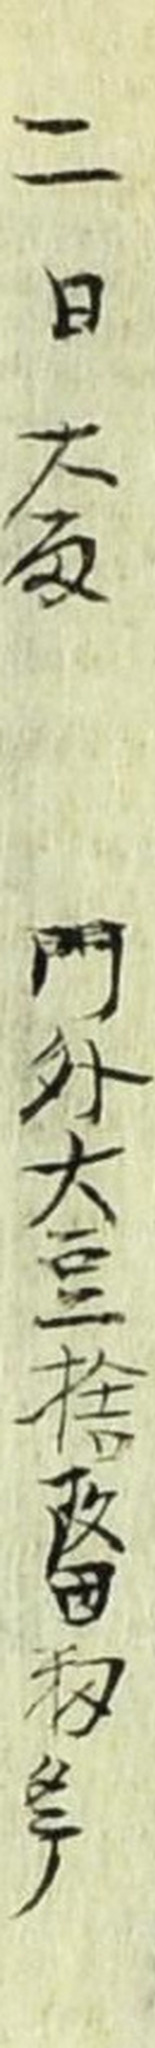二日大雨門外大豆捨改田籾タテ
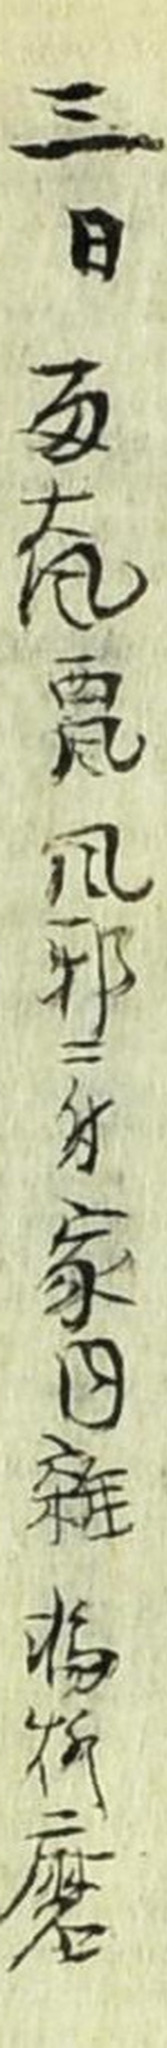三日雨大風西風風邪に付家内雑輪灯磨
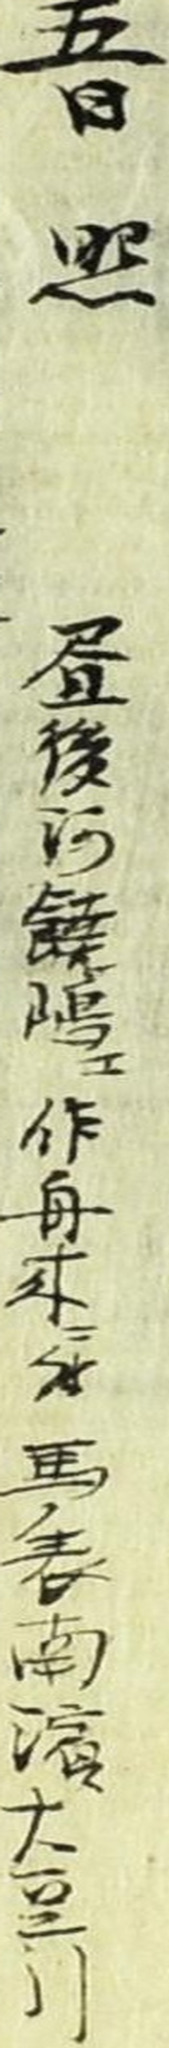五日照昼後河饒島江作舟来ニ付馬ノ表南浜大豆引
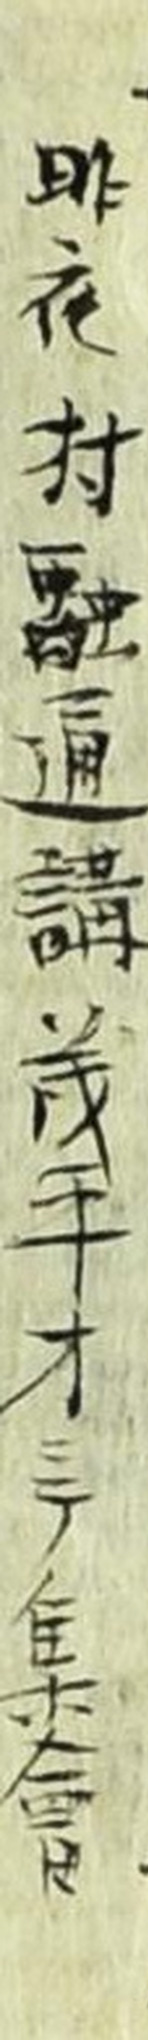昨夜村融通講茂平方にて集会
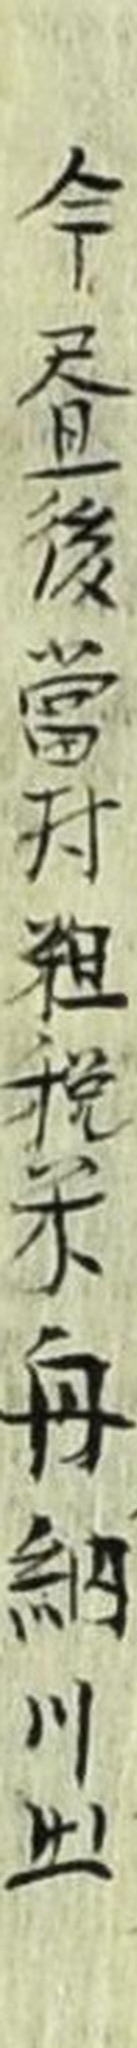今昼後当村租税米舟納川出
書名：（日記）
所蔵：福井県文書館 Fukui Prefectural Archives
